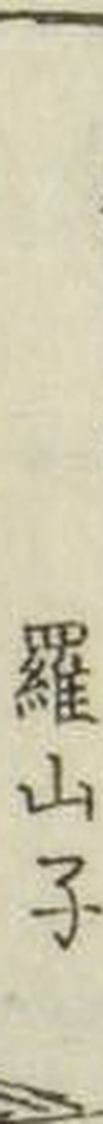羅山子
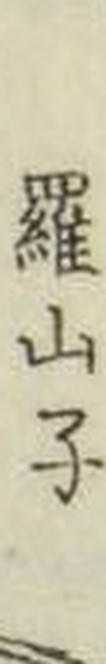羅山子

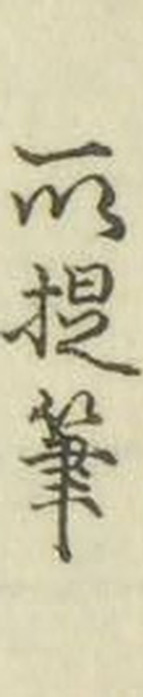所提筆
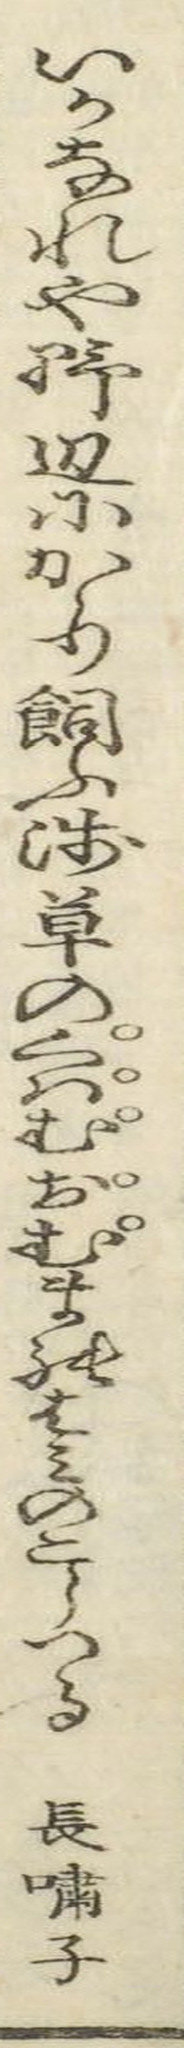いかなれや野辺にかり飼ふ浅草のくはむおむまのはみのこしつる長嘯子
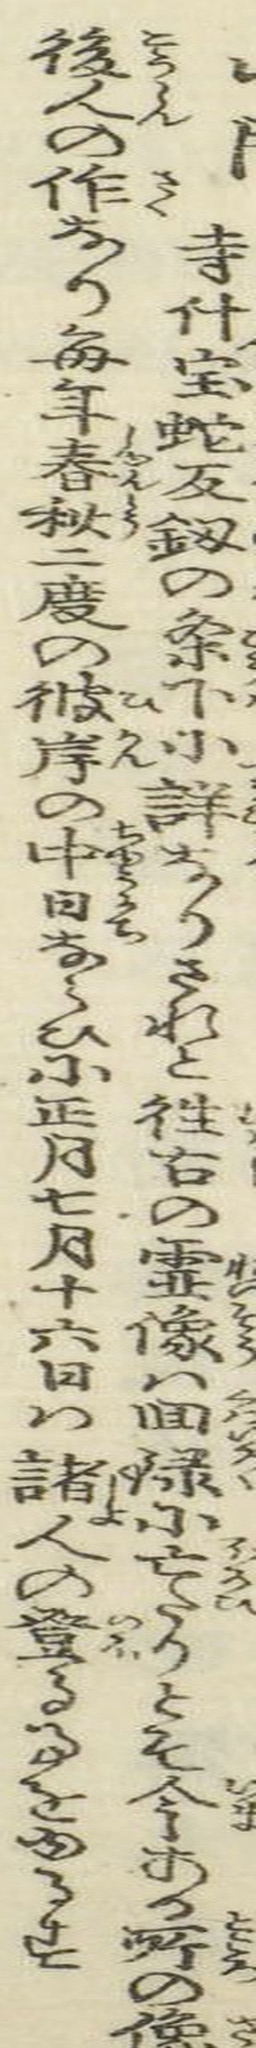後人の作なり毎年春秋二度の彼岸の中日ならひに正月七月十六日は諸人の登る事をゆるす

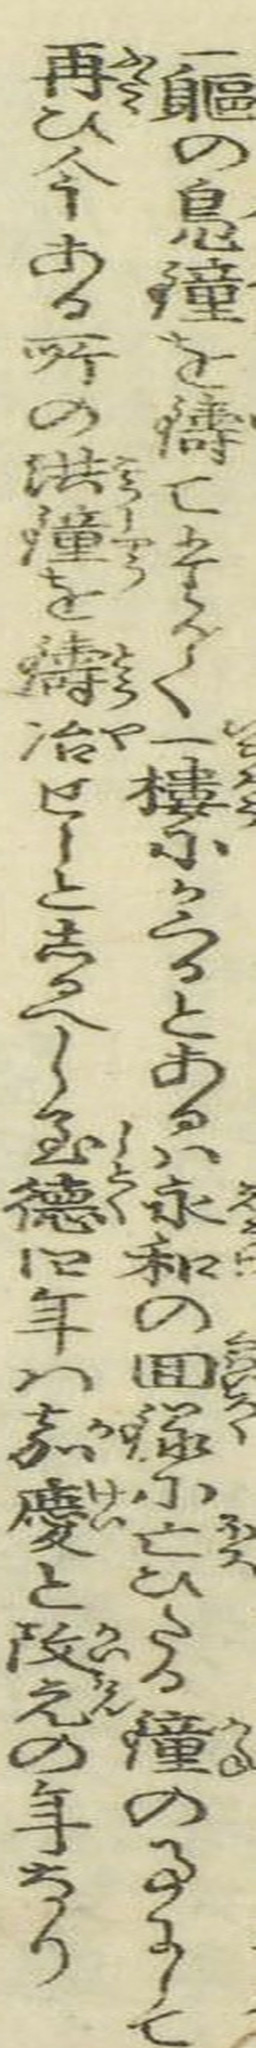再ひ今ある所の洪鐘を鋳冶せしとしるへし至徳四年は嘉慶と改元の年なり
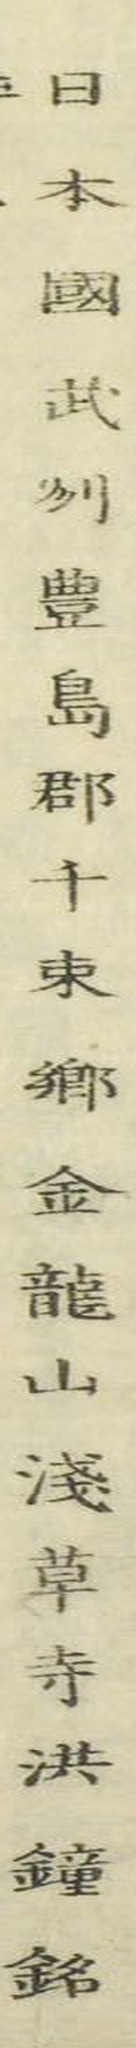日本国武州豊島郡千束郷金龍山浅草寺洪鐘銘
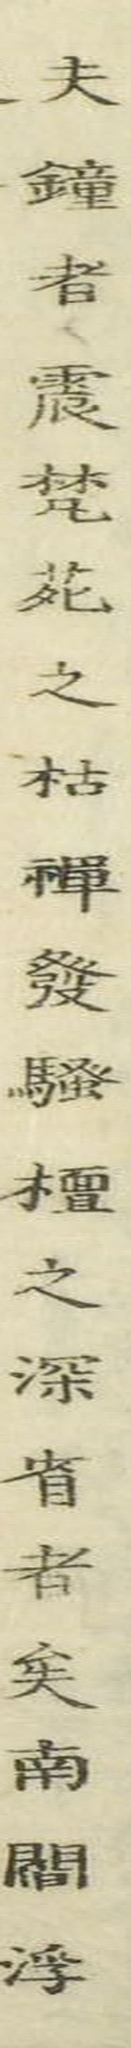夫鐘者震梵苑之枯禅発騒檀之深省者矣南閻浮
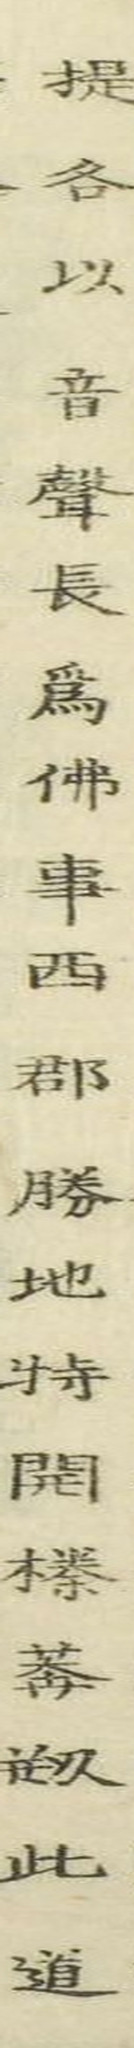提各以音声長為仏事西郡勝地特開榛莾剏此道
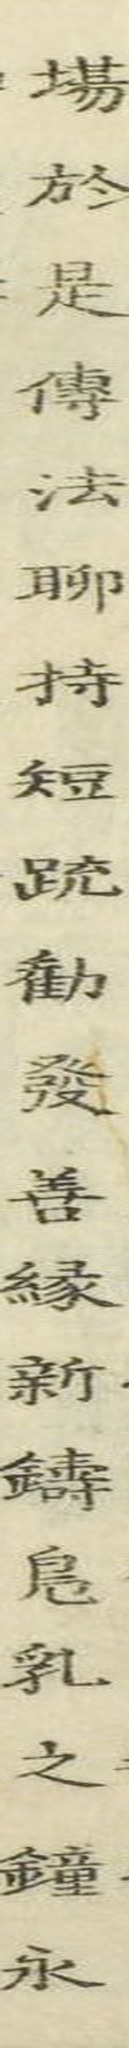場於是傳法聊持短勧発善縁新鋳鳬乳之鐘永
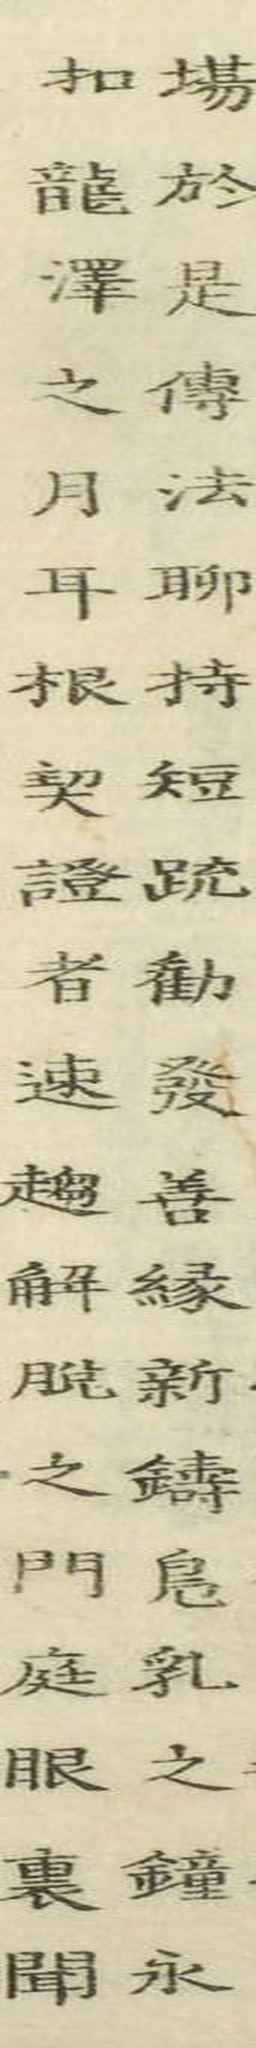扣龍沢之月耳根契證者速趨解脱之門庭眼裏聞
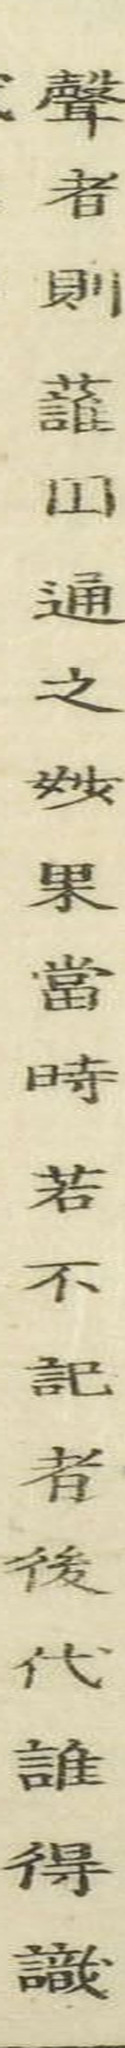声者則円通之妙果当時若不記者後代誰得識
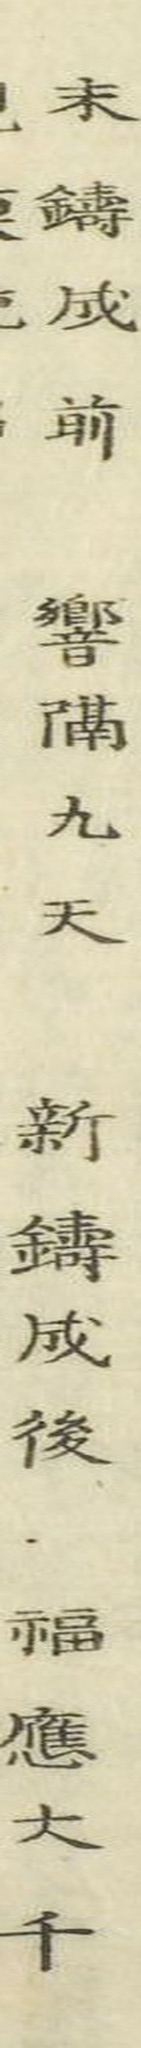末鋳成前響隔九天新鋳成後福応大千
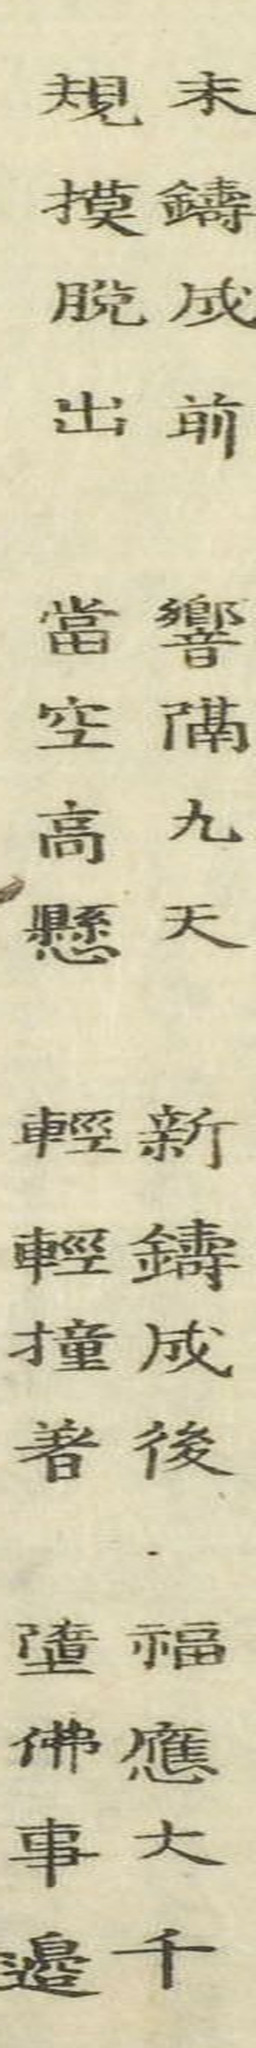規摸脱出当空高懸軽軽撞着堕仏事辺
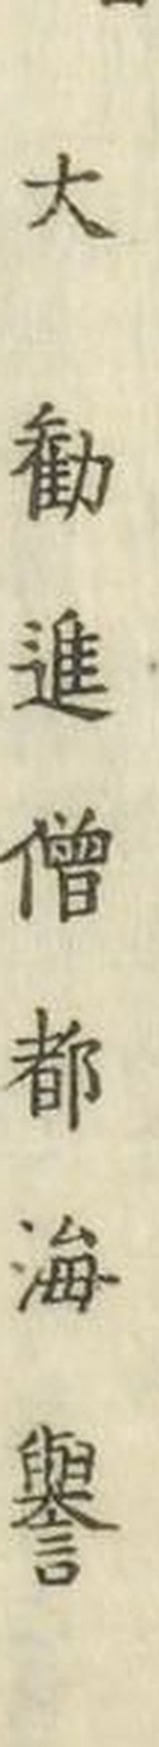大勧進僧都海誉
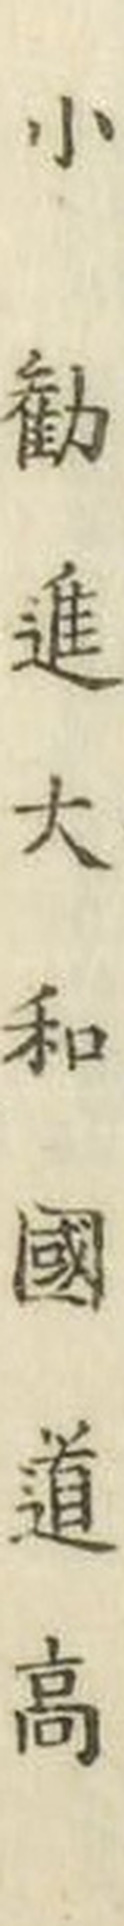小勧進大和国道高
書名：江戸名所図会 20巻 巻之16
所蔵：東京学芸大学教育コンテンツアーカイブ
